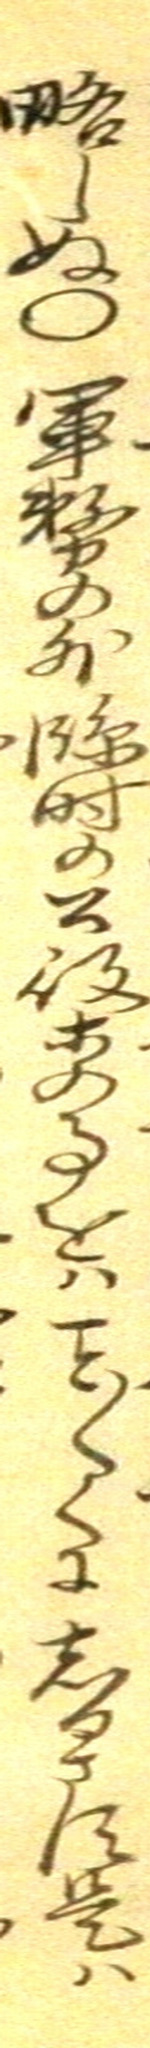略しぬ○軍務の外臨時の公役等の事をはこと〳〵くにしるさす是は
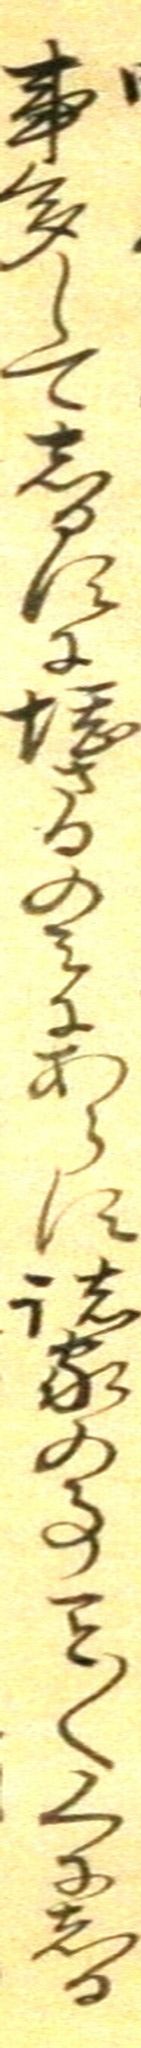事多してしるすに堪さるのみにあらす諸家の事こと〳〵くにしる
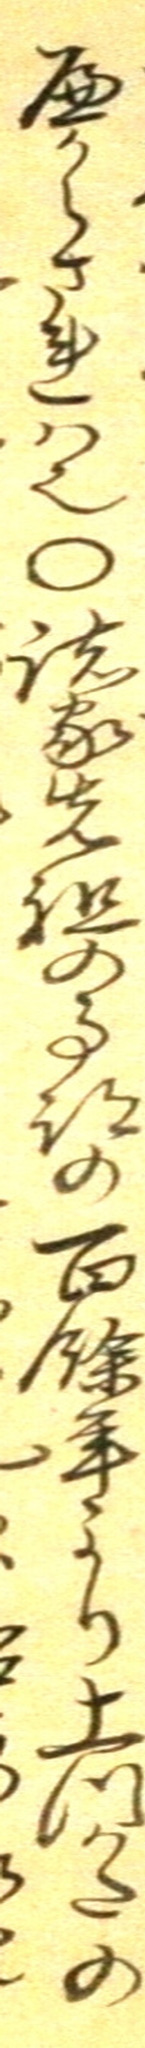へからされは也○諸家先祖の事跡の百余年より上つかたの
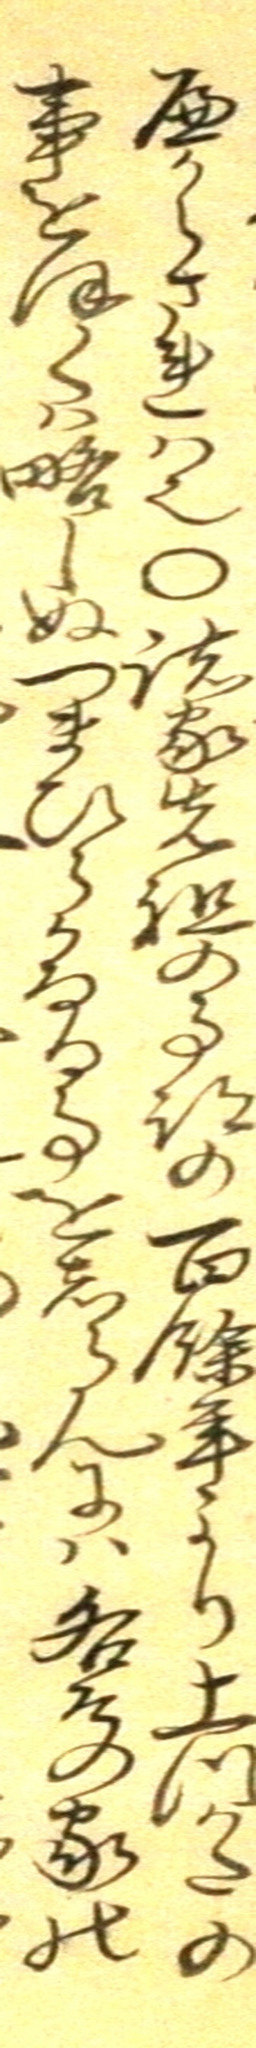事をほくは略しぬつまひらかなる事をしらんには各その家の
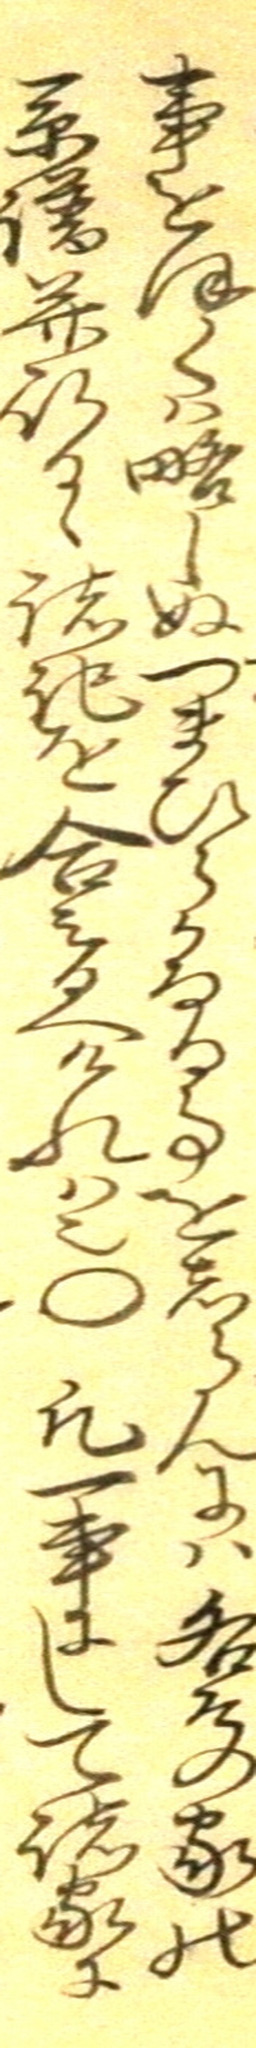系譜并行るゝ諸記を合みるへけれは也○凡一事にして諸家に
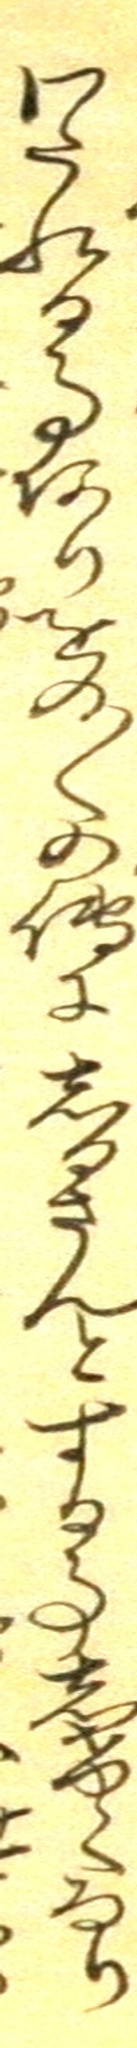わたれる事ありをの〳〵の伝にしるさんとする事しけくなり
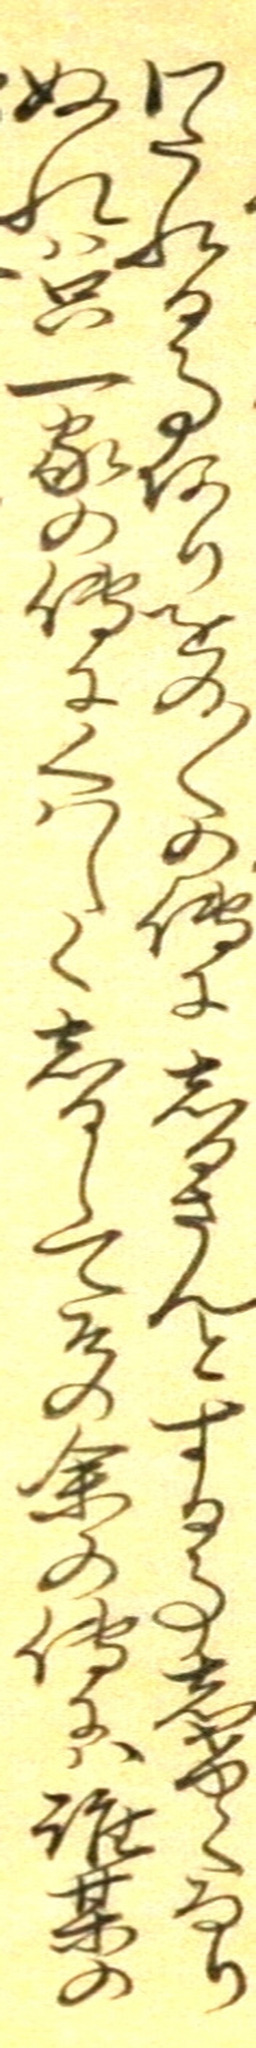ぬれは只一家の伝にくはしくしるしてその余の伝には誰某の
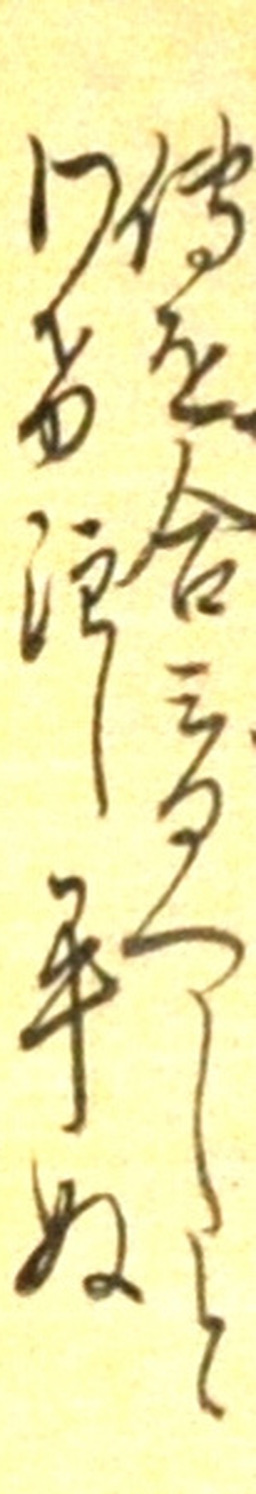わけ注し畢ぬ
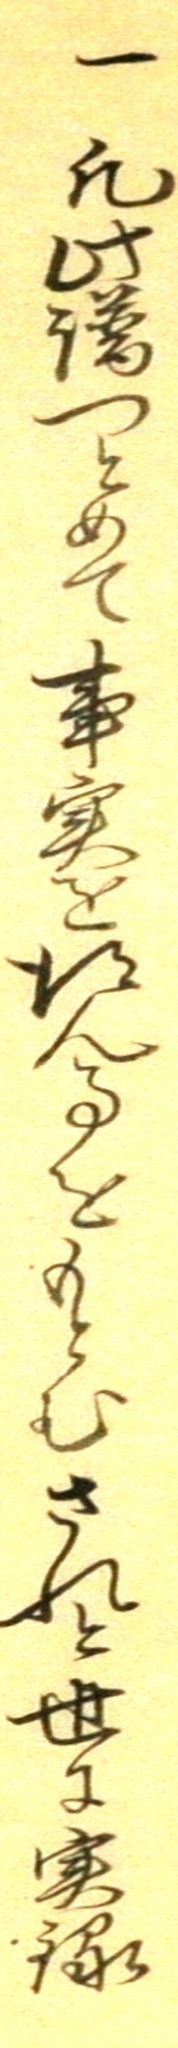一凡此譜つとめて事実を得ん事をもとむされと世に実録
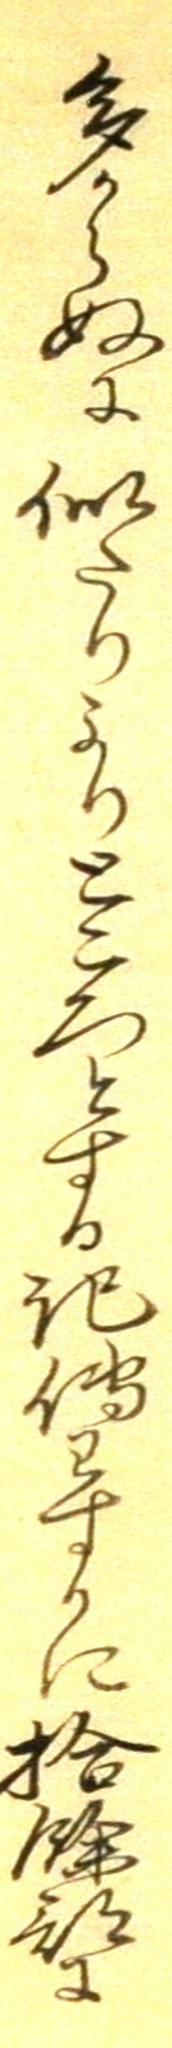多からぬに似たりよりところとする記伝わすかに拾余部に
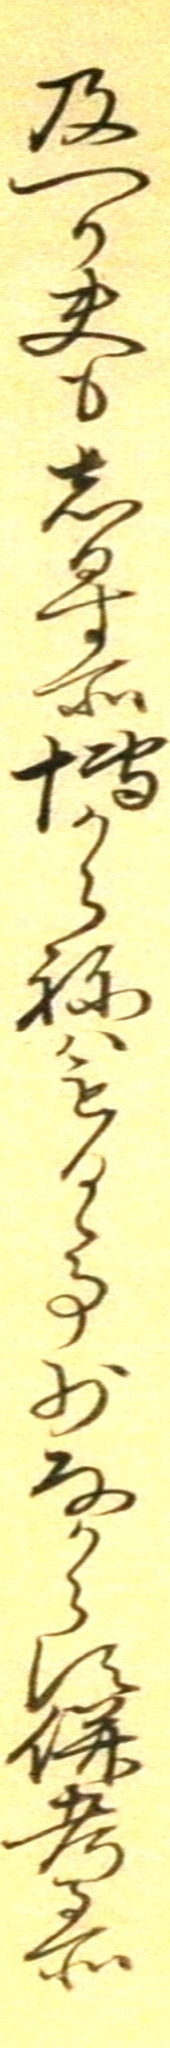及へり夫もしるす所博からねはもるゝ事少なからす併考る所
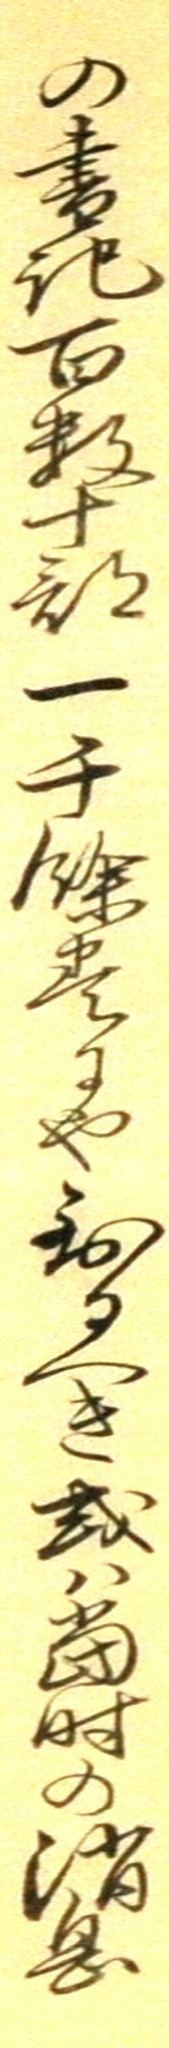の書記百数十部一千余巻にや到るへき或は当時の消息
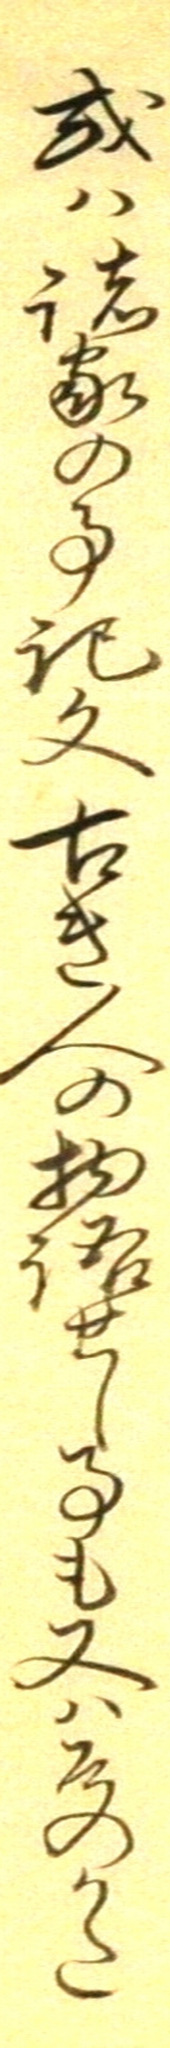或は諸家の事記文古き人の物語せし事も又はそのかた
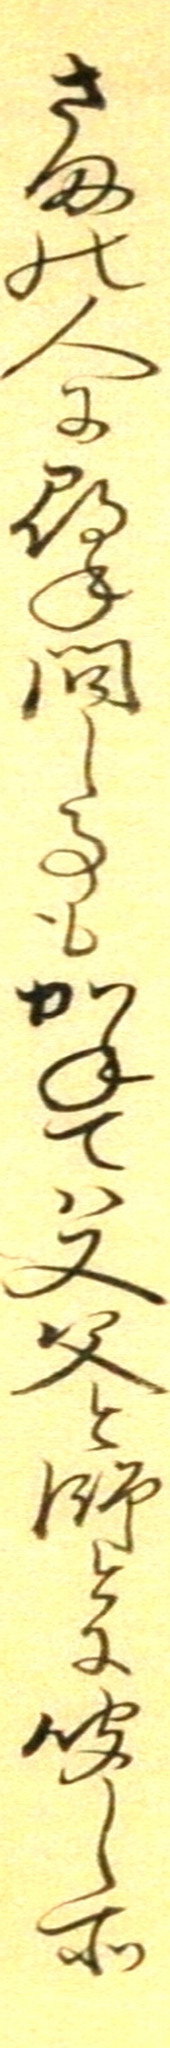さまの人に尋ね問し事もかねては又父と師とに聞し所
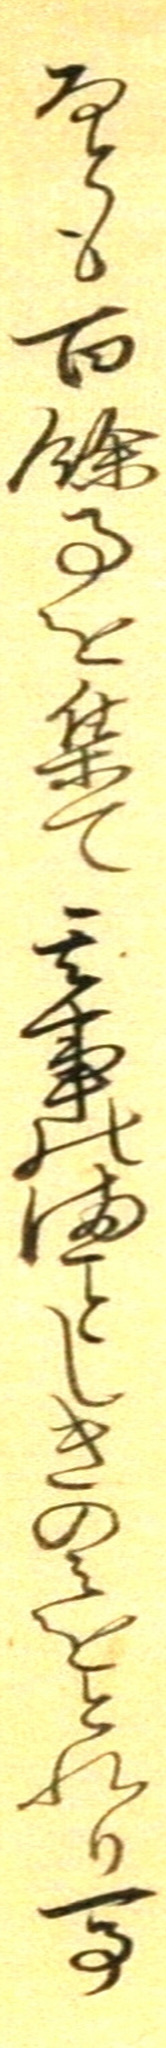なとも百余事を集て其事のまことしきのみをとれり一事
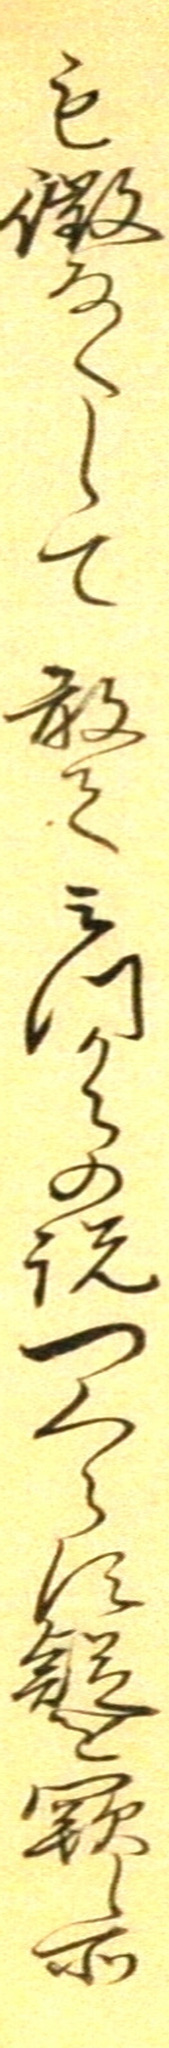も徴なくして敢てｍみつからの説つくらす疑を闕し所
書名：藩翰譜（一）
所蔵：伊那市立高遠町図書館・合同会社AMANE
